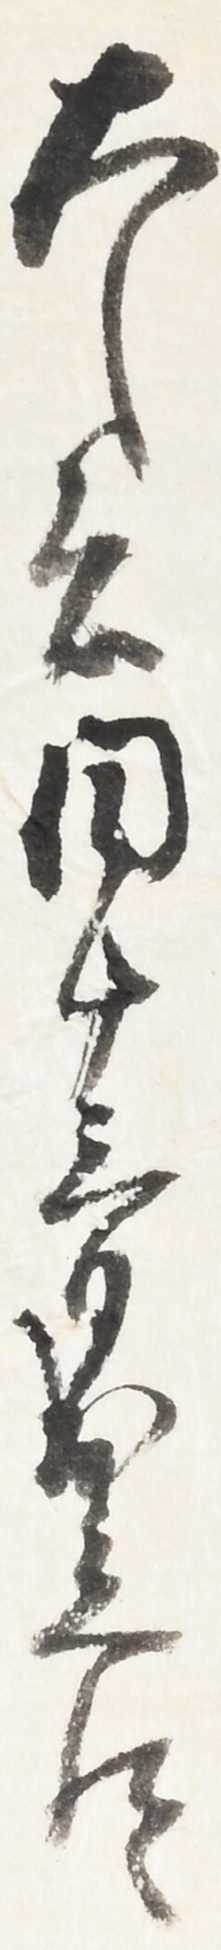右之者同十三日出立仕候
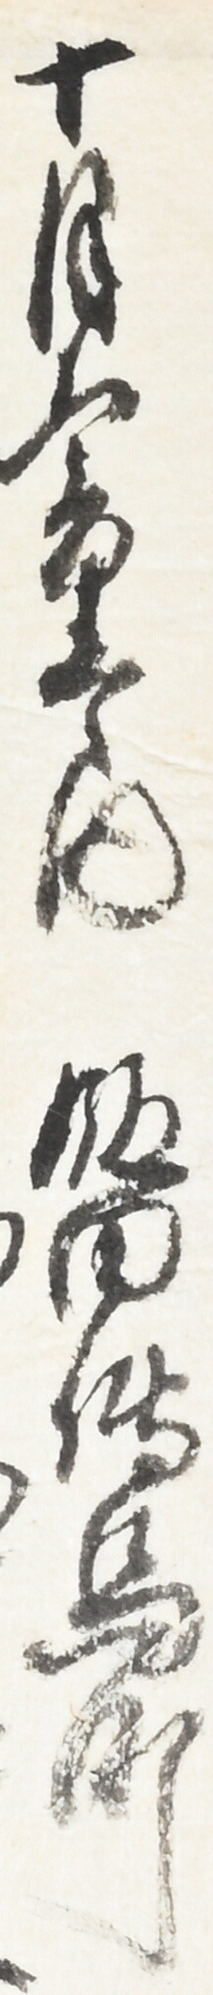十月書上之内飯田伝馬町
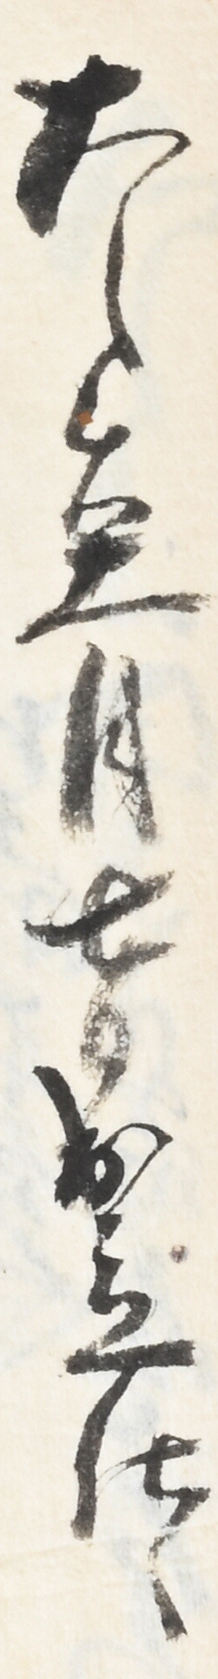右之者同八日出立仕候
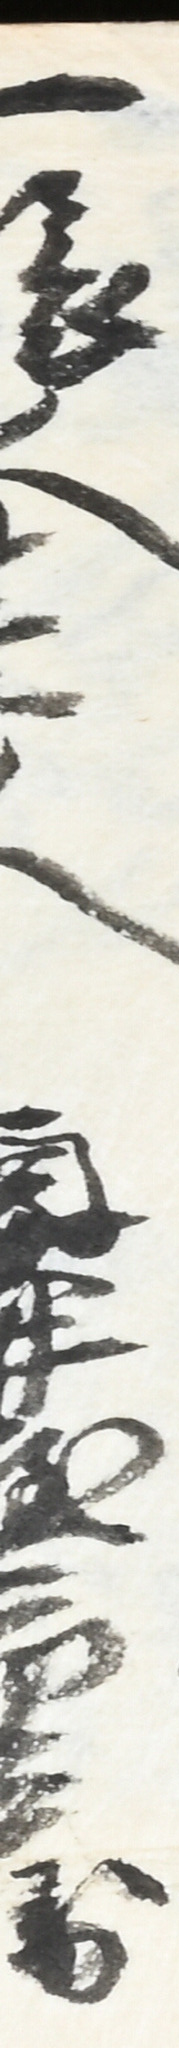一旅人壱人菱屋利兵衛

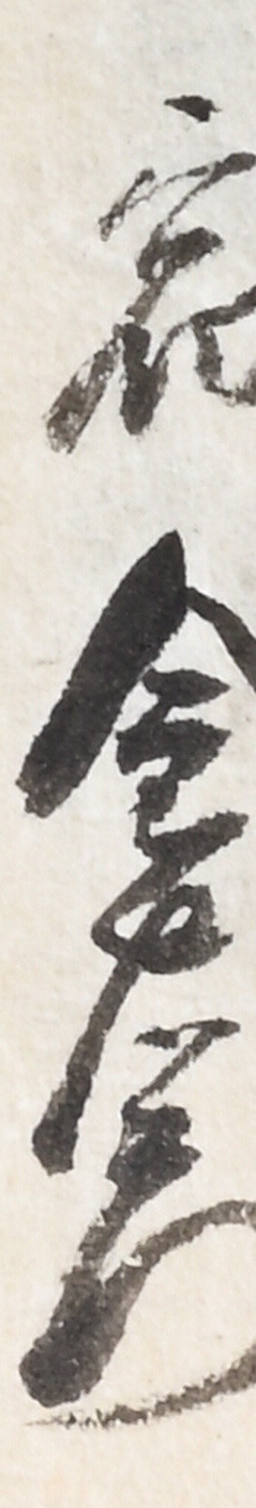宿常右衛門
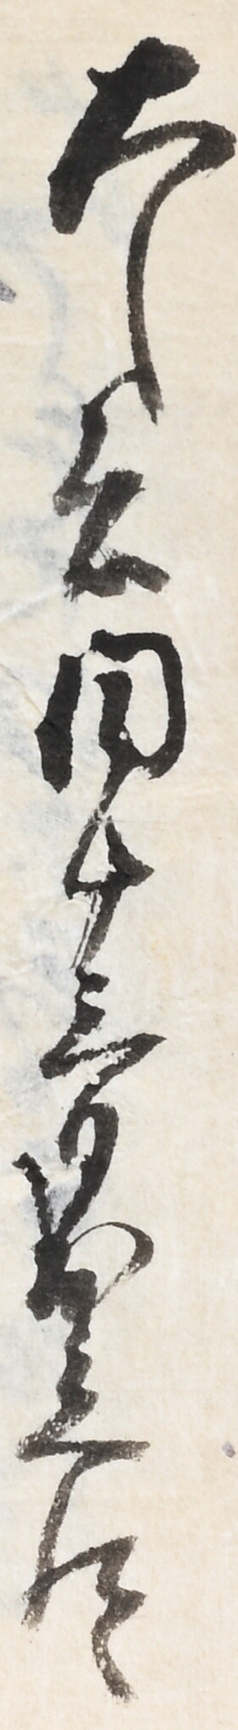右之者同十六日出立仕候
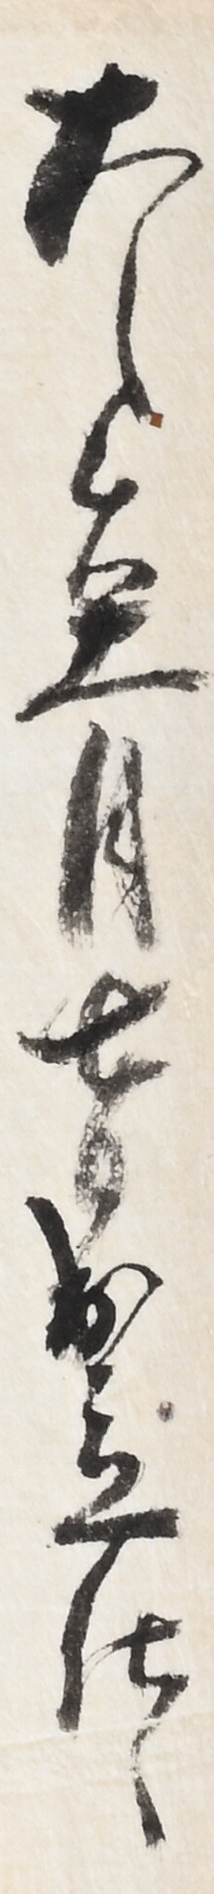右之者十一月七日出立仕候
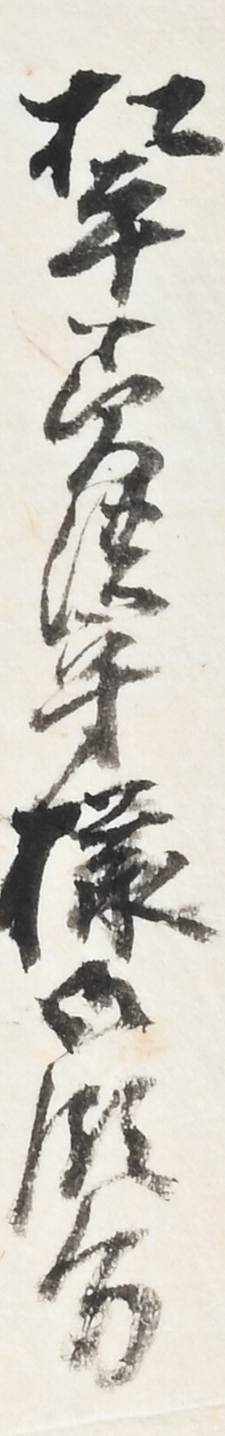松平美濃守様御領分
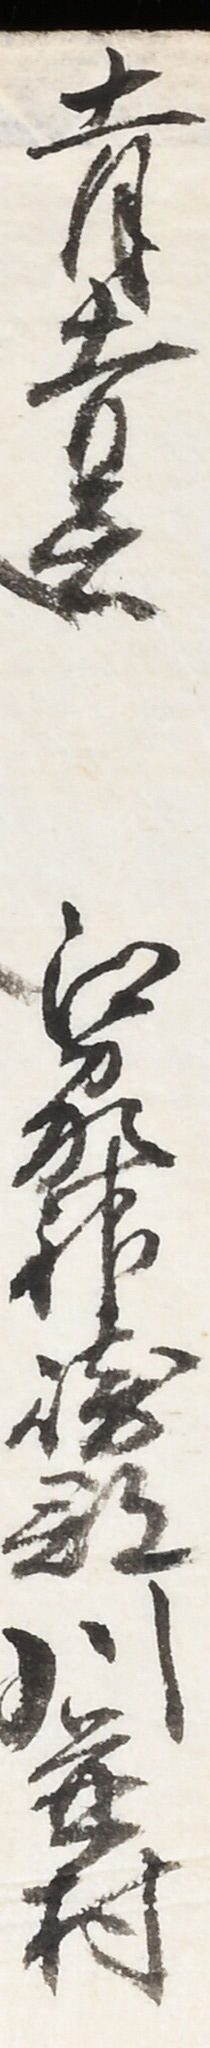十一月十一日着江州神崎郡川並村
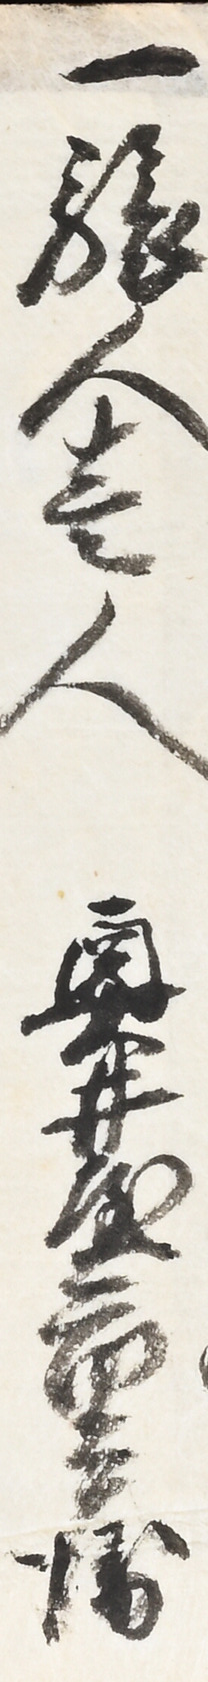一旅人壱人奥井屋市兵衛
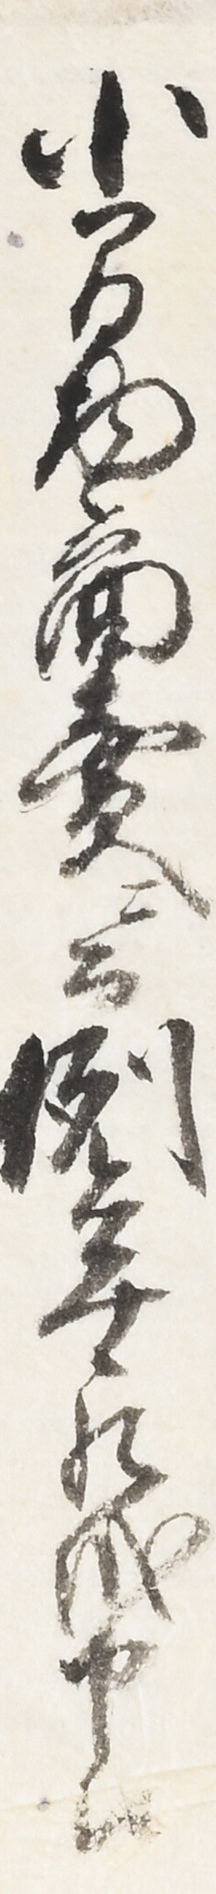小間物商売ニ而例年罷越申候
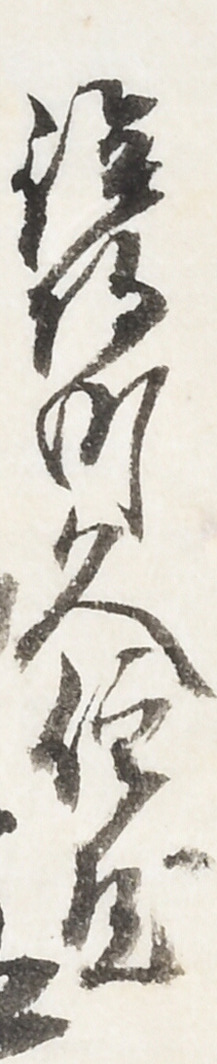鉾持町久住屋
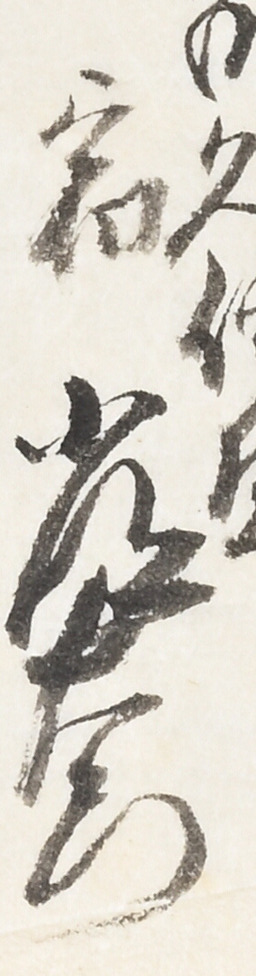宿常右衛門
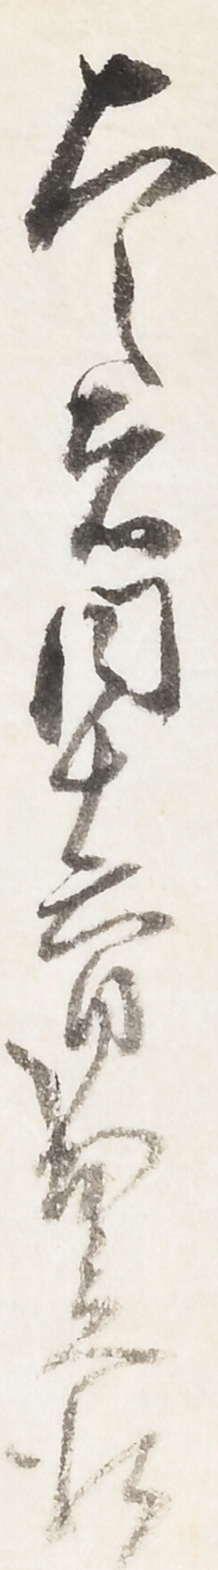右之者同十六日出立仕候
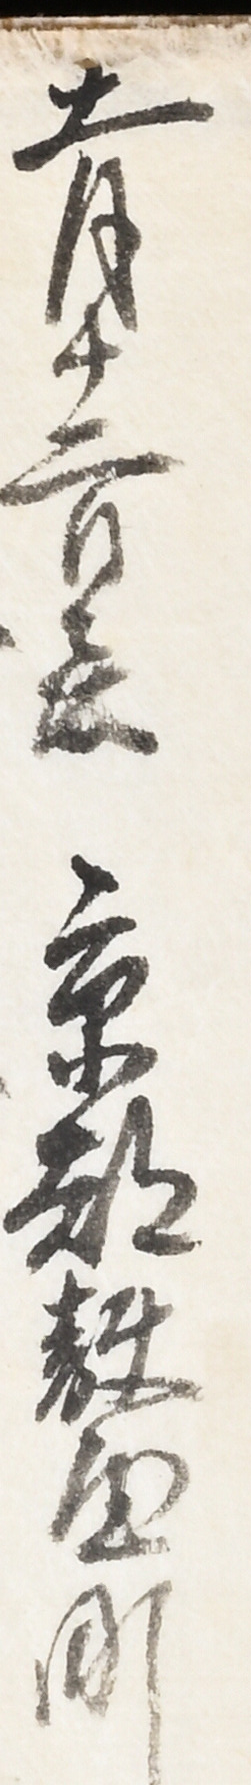十一月十二日着京都麩屋町
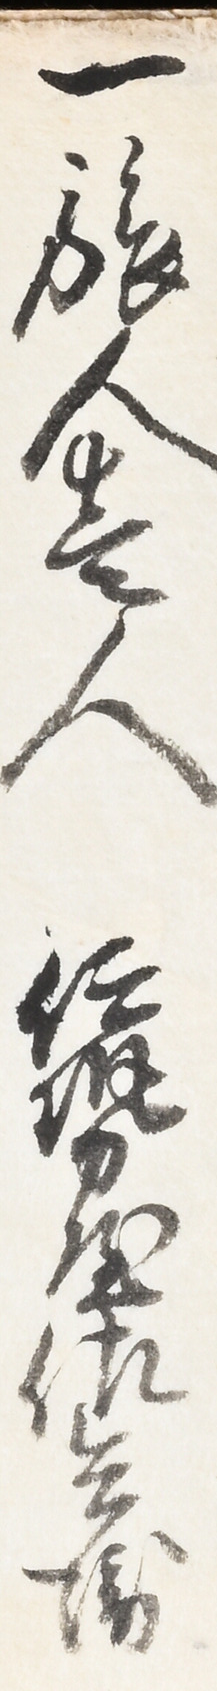一旅人壱人伊勢屋佐兵衛
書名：旅人泊控帳
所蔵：伊那市立高遠町図書館・合同会社AMANE
